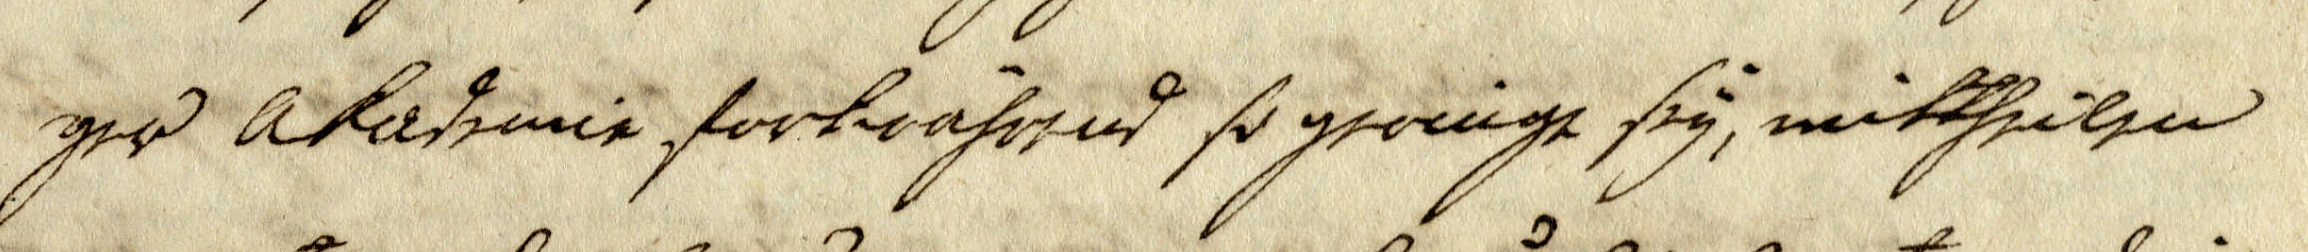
ger Akademie fortwährend so geringe seÿ, mittheilen
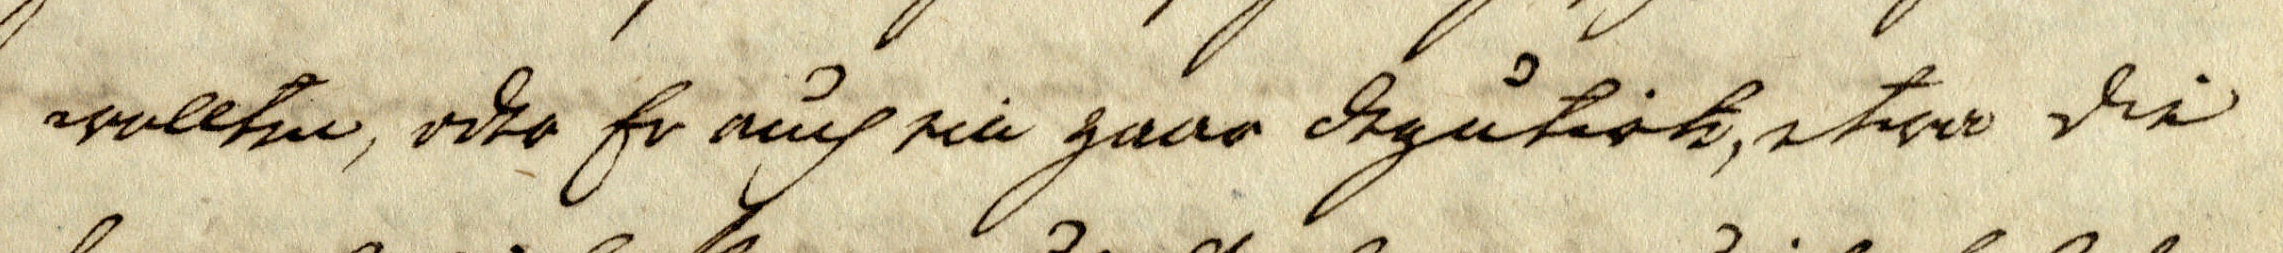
wollten, oder Er auch ein paar Deputirte, etwa die
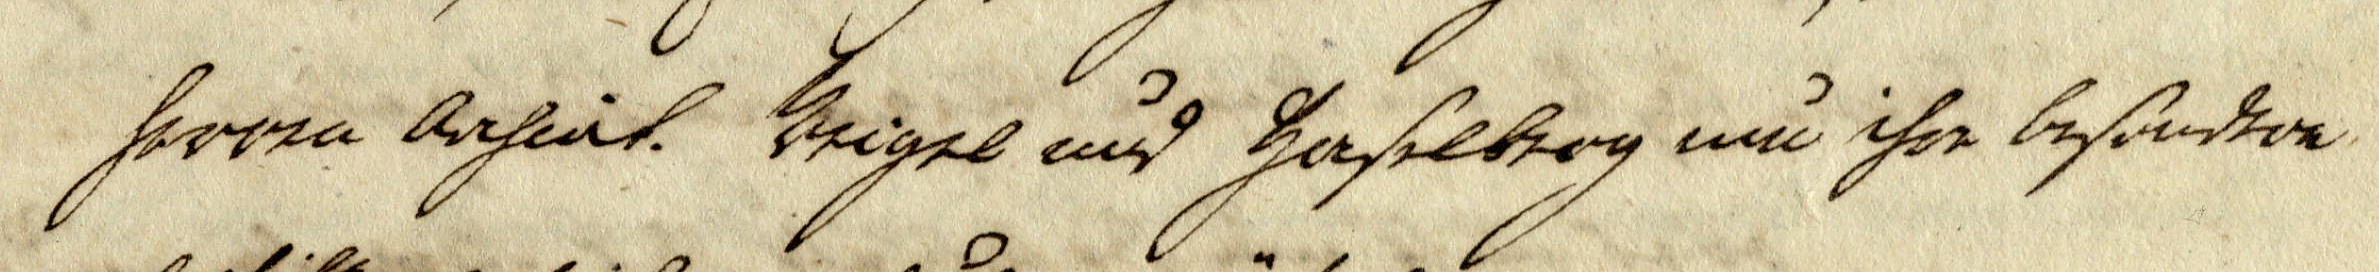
Herren Archiat. Weigel und Haselberg um ihre besondere
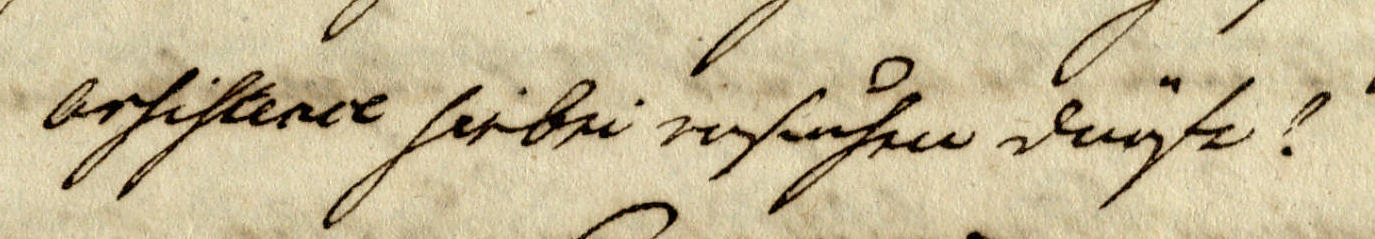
Assistence hiebei ersuchen dürfe?
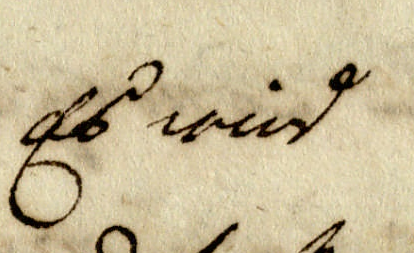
Es wird
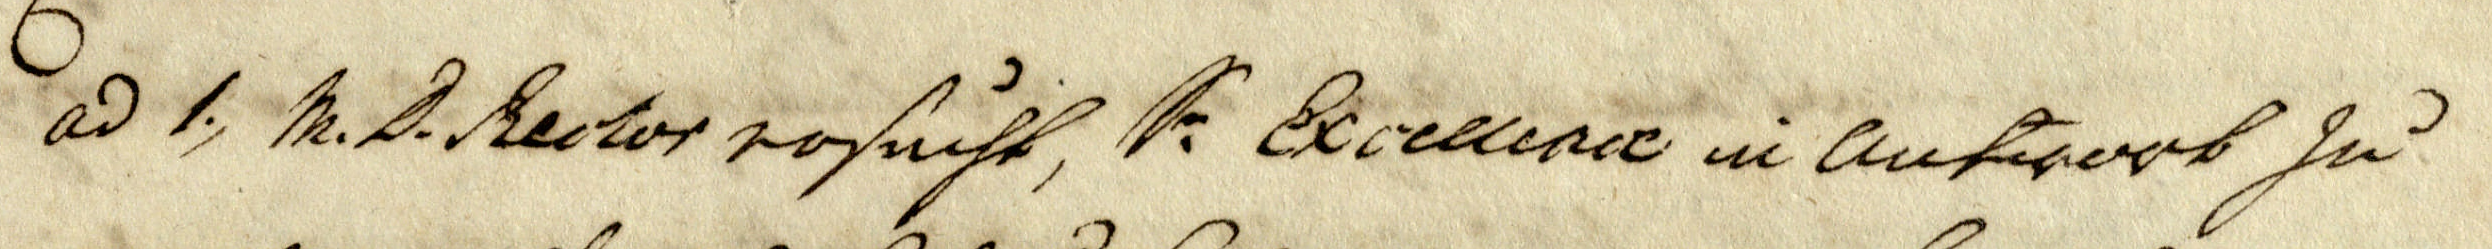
ad 1., M. D. Rector ersucht, Sr Excellence in Antwort zu
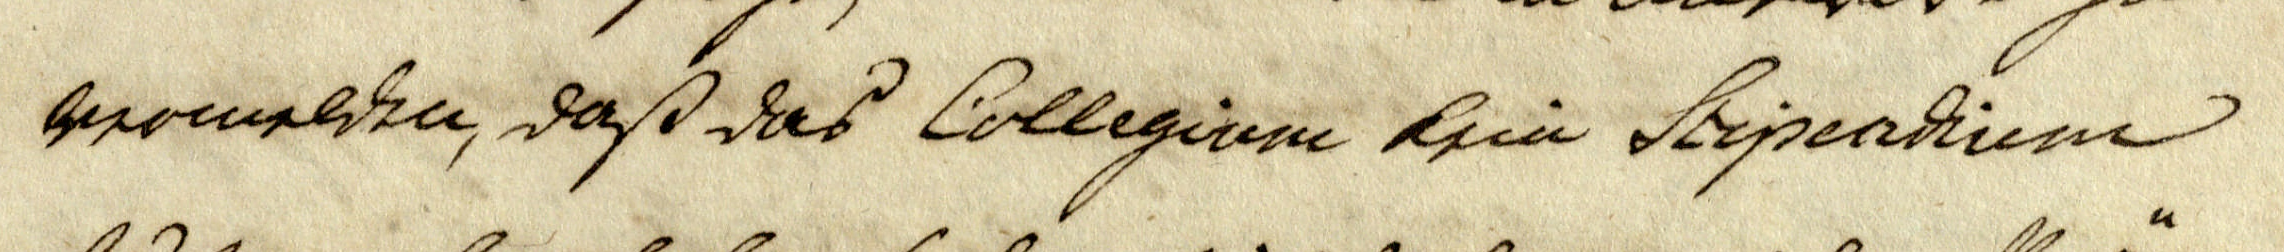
vermelden, daß das Collegium kein Stipendium
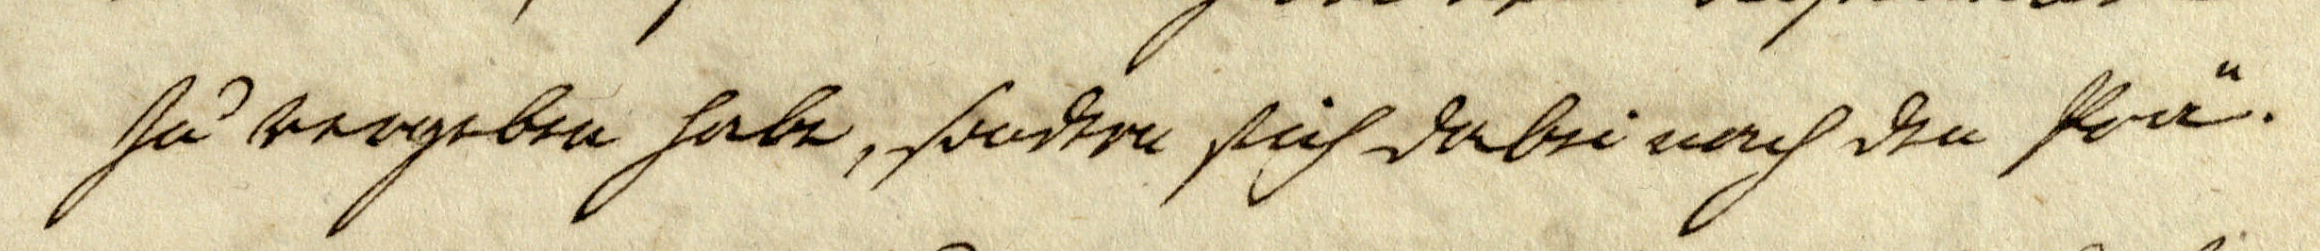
zu vergeben habe, sondern sich dabei nach den Prä¬
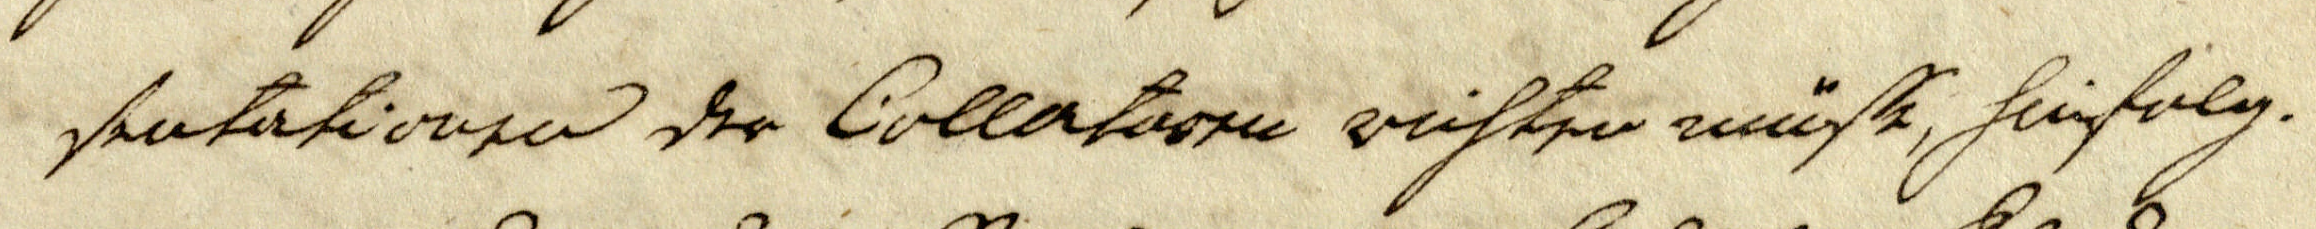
sentationen der Collatoren richten müsse, hinfolg¬
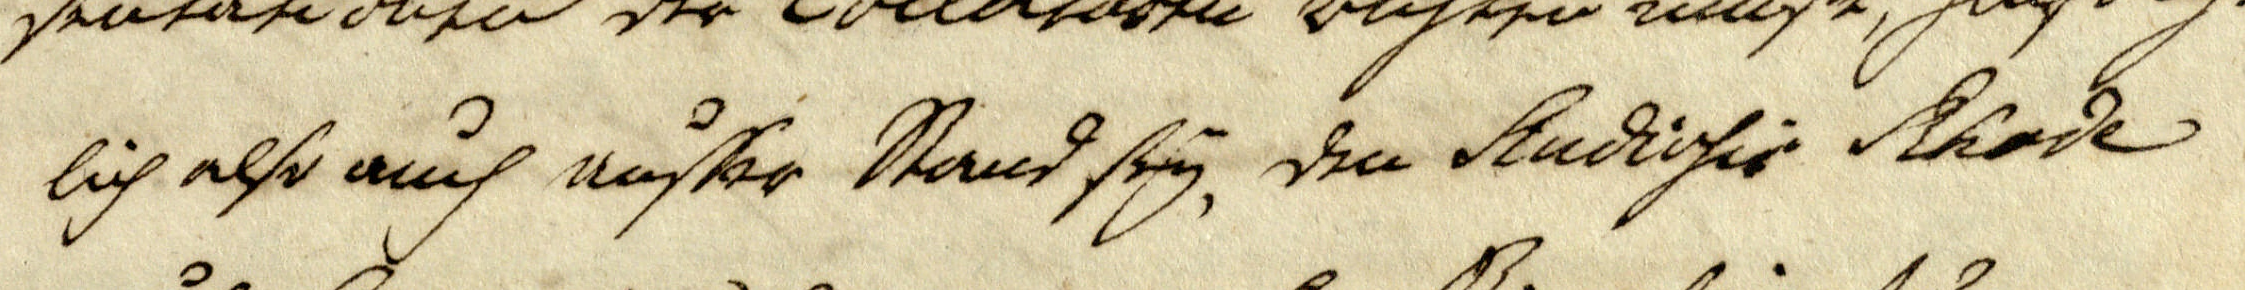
lich also auch ausser Stand seÿ, den Studiosis Rhode
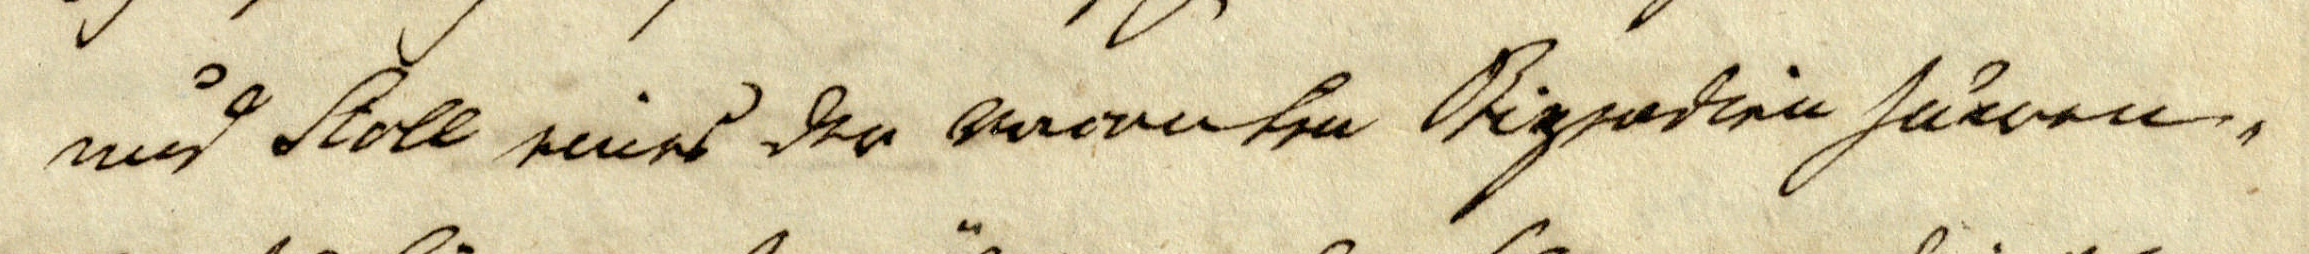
und Stoll eines der vacanten Stipendien zuwen¬
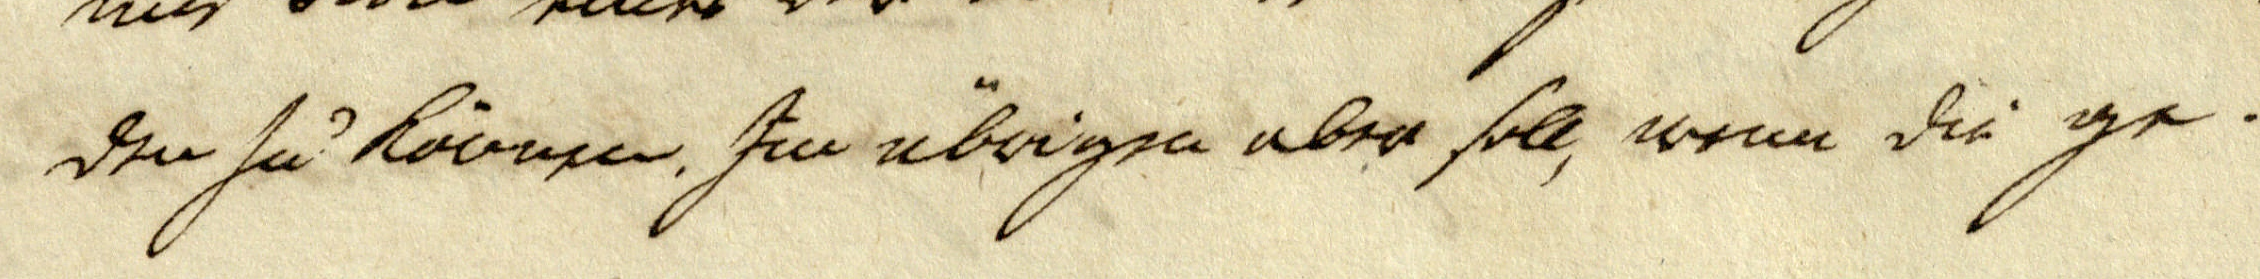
den zu können. Im übrigen aber soll, wenn die ge¬
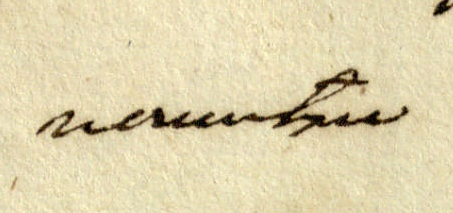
genannten
